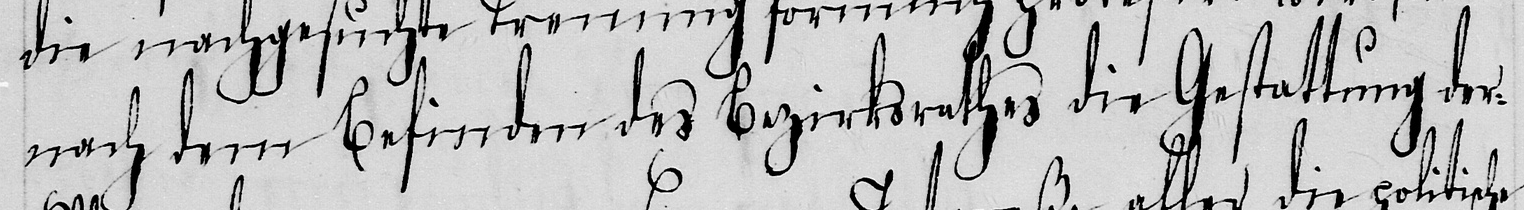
nach dem Befinden des Bezirksrathes die Gestattung de¬
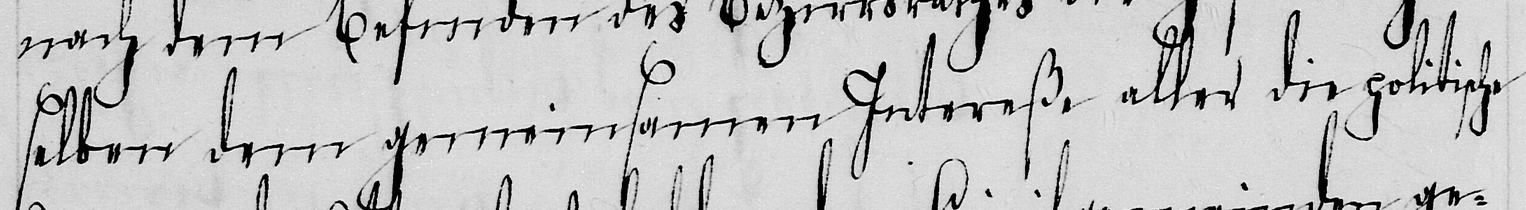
selben dem gemeinsamen Intereße aller die politisc¬
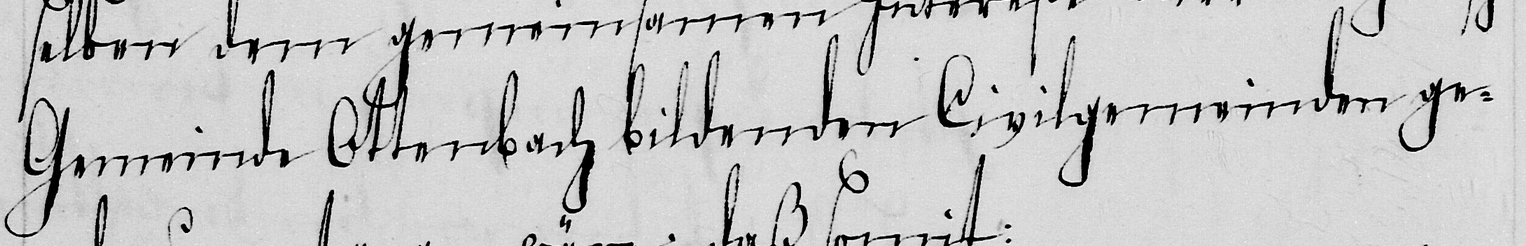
Gemeinde Ottenbach bildenden Civilgemeinden ge¬
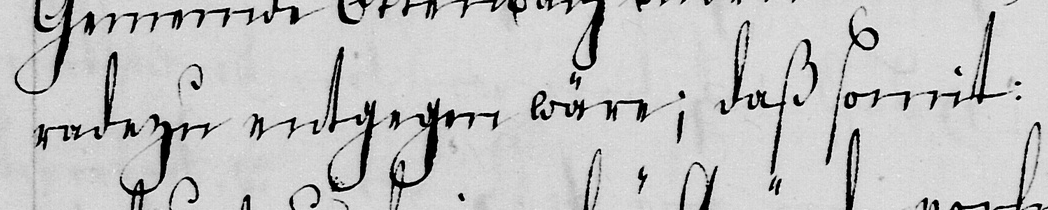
radezu entgegen wäre; daß somit:
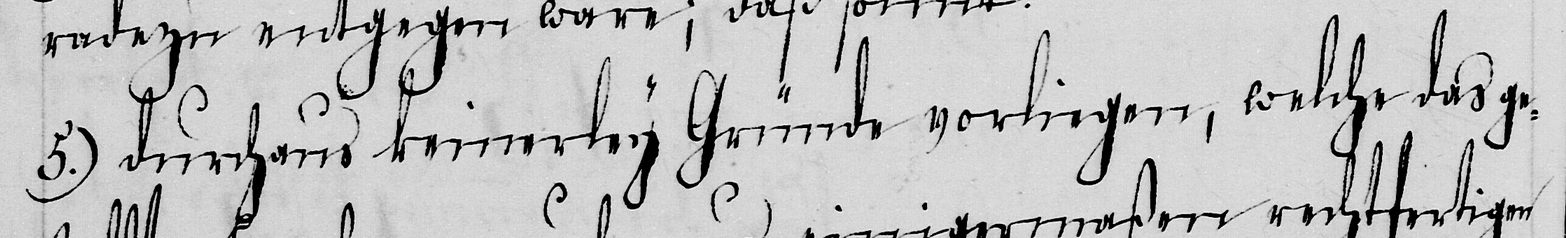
5.) durchaus keinerley Gründe vorliegen, welche das g¬
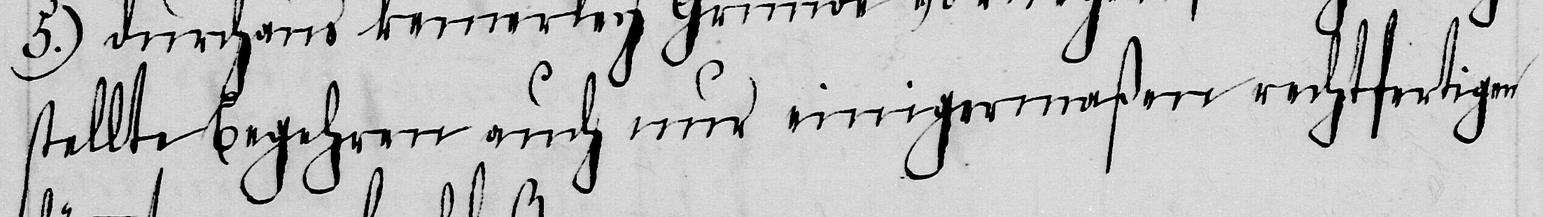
estellte Begehren auch nur einigermaßen rechtfertigen
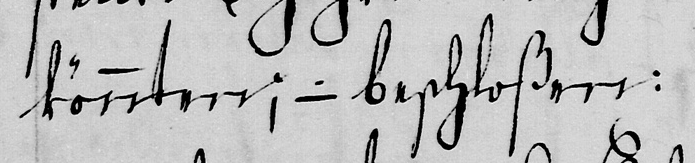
könnten; – beschloßen:
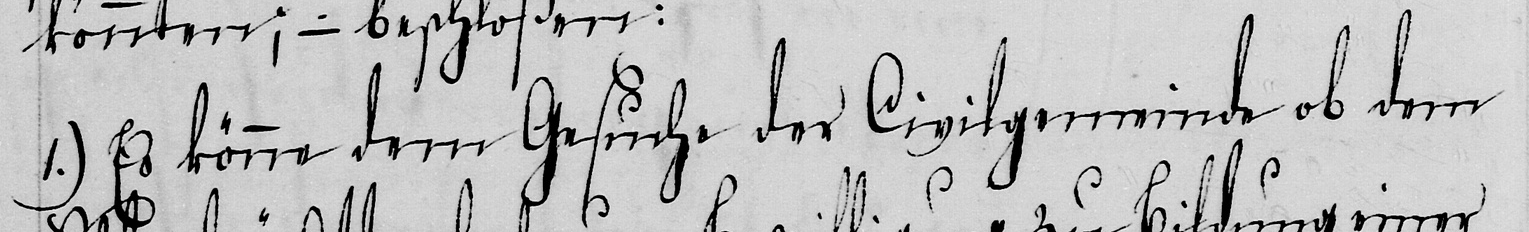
1.) Es könne dem Gesuche der Civilgemeinde ob dem
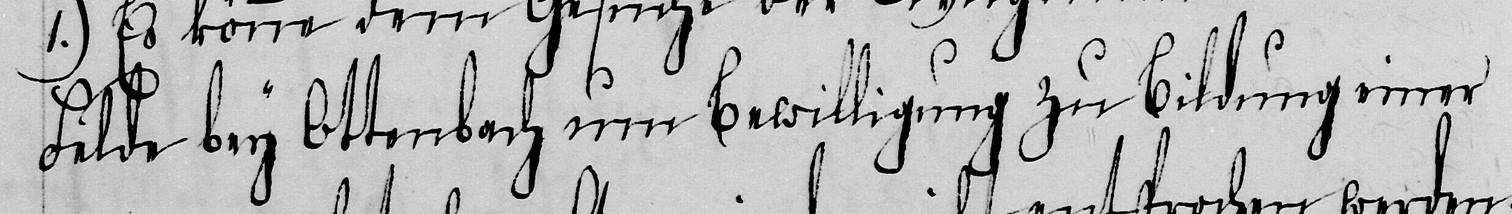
Felde bey Ottenbch um Bewilligung zu Bildung einer
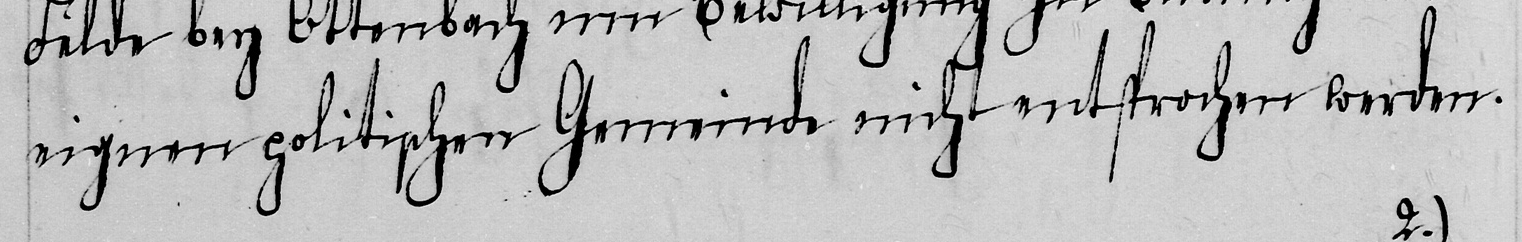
eigenen politischen Gemeinde nicht entsprochen werden.
